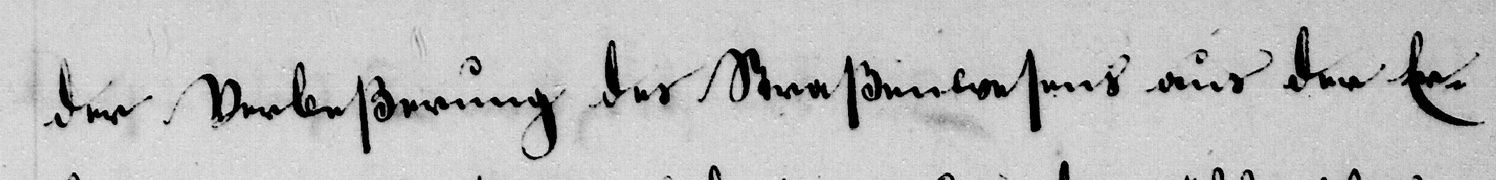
der Verbeßerung des Straßenwesens aus der Er¬
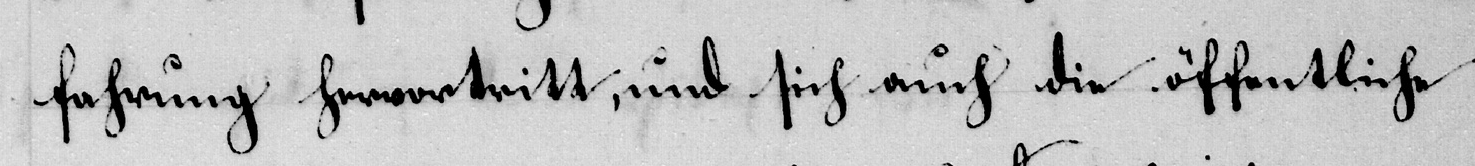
fahrung hervortritt, und sich auch die öffentliche
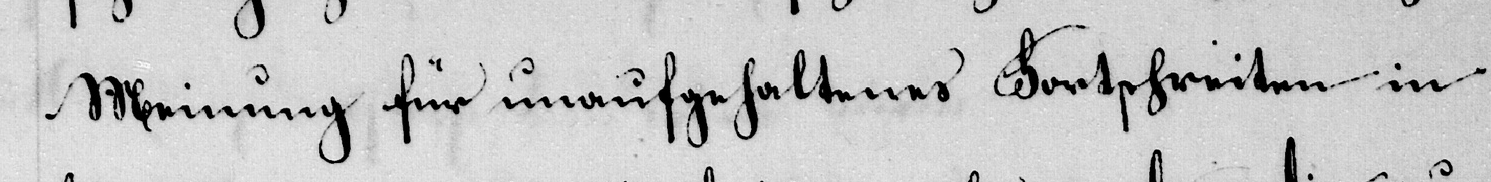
Meinung für unaufgehaltenes Fortschreiten in
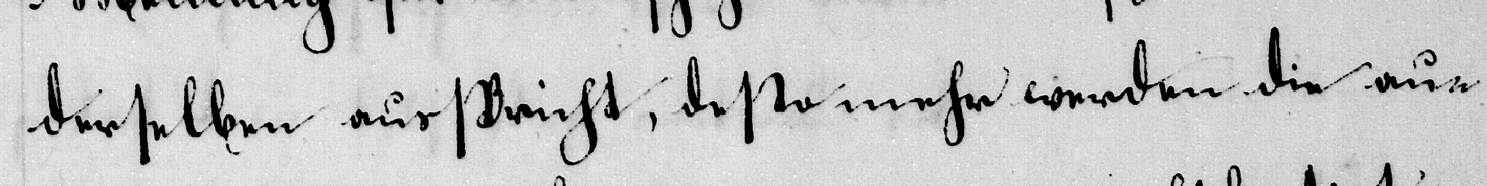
derselben ausspricht, desto mehr werden die au¬
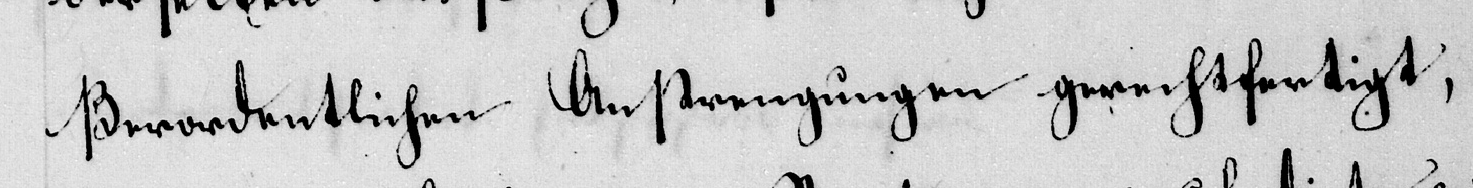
ßerordentlichen Anstrengungen gerechtfertigt,
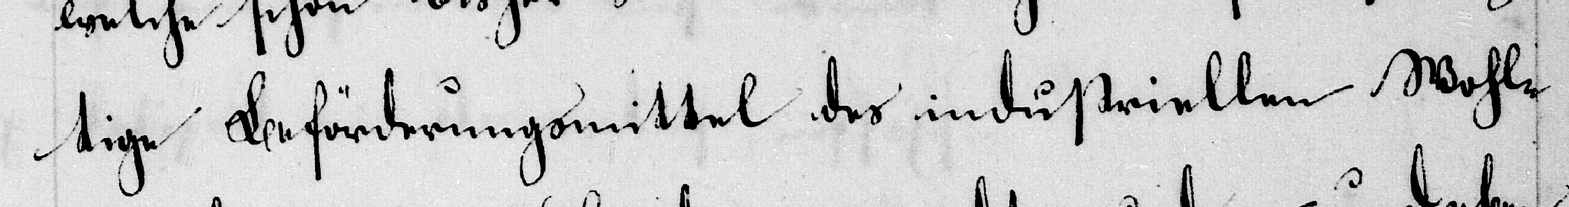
tige Beförderungsmittel des industriellen Wohl¬
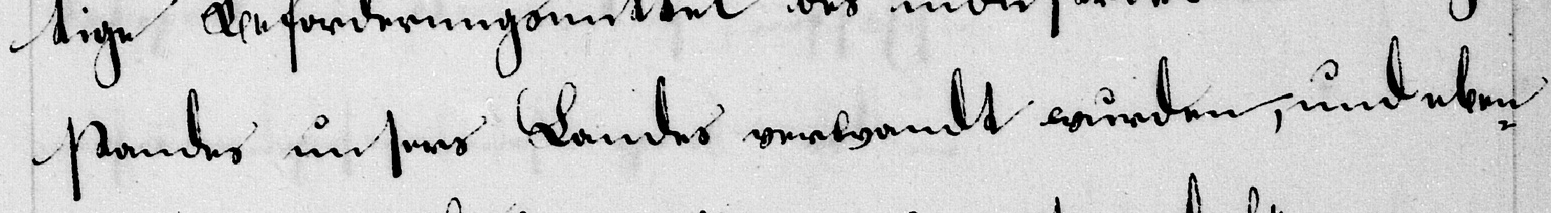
standes unsers Landes verwandt wurden, und eben¬
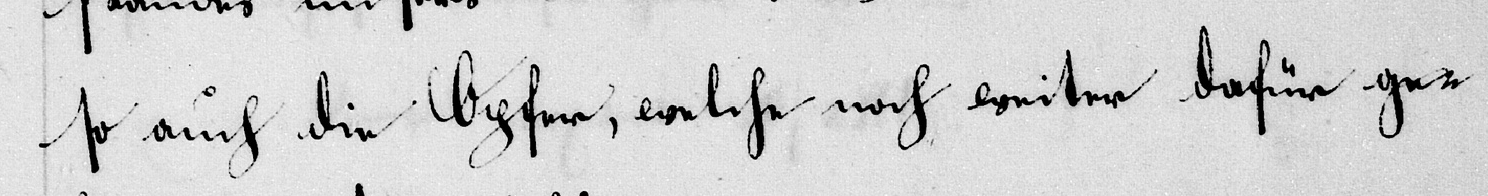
so auch die Opfer, welche noch weiter dafür ge¬
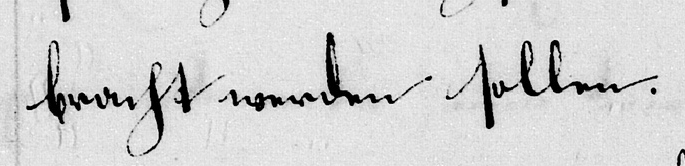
bracht werden sollen.
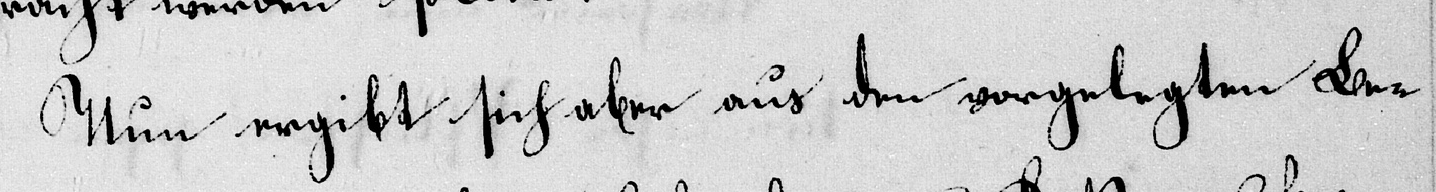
Nun ergibt sich aber aus den vorgelegten Be¬
